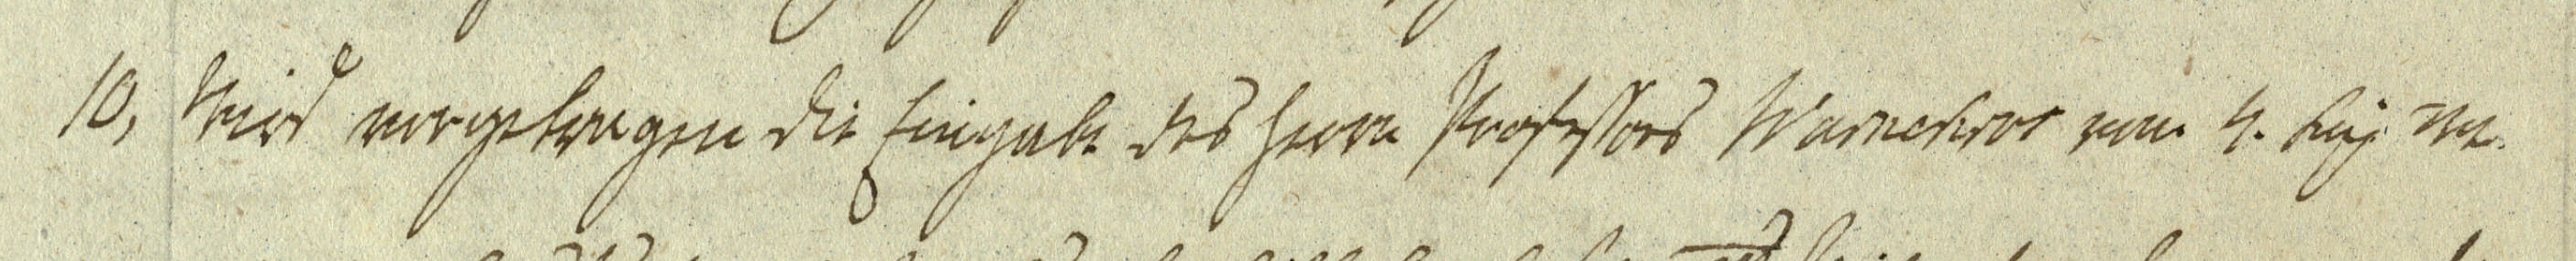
10, Wird vorgetragen die Eingabe des Herrn Professors Warnekros von 4. huj. we¬
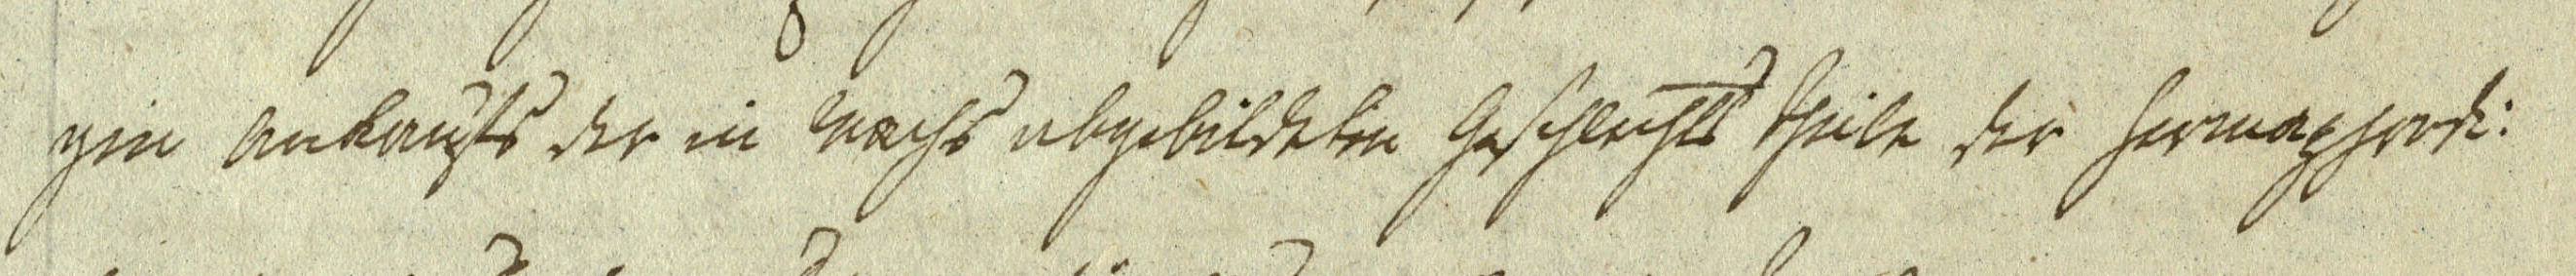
gen Ankaufs der in Wachs abgebildeten Geschlechts Theile der Hermaphrodi¬
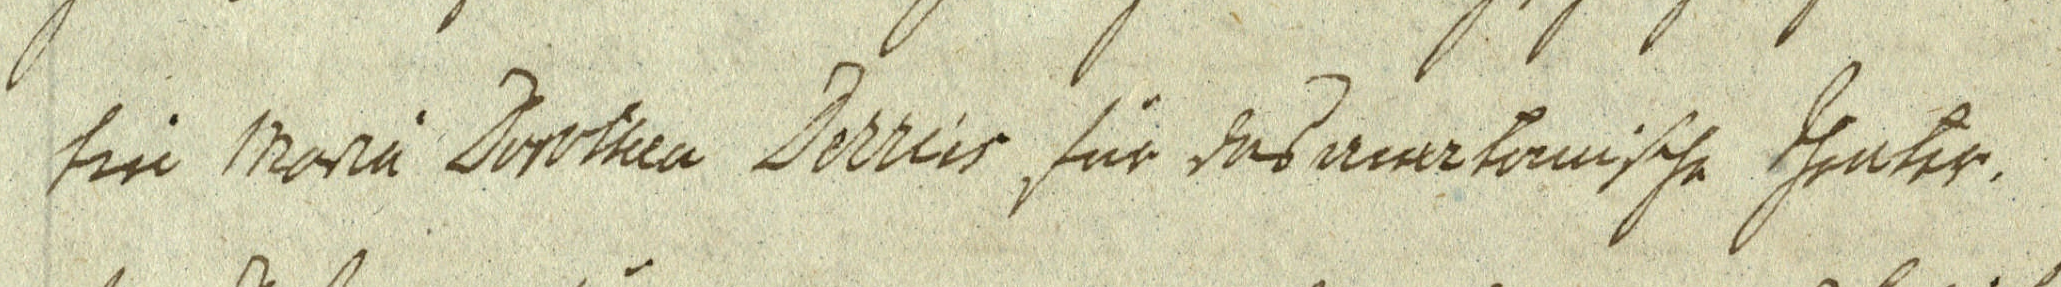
tin Marie Dorothea Derries für das anatomische Theater¬
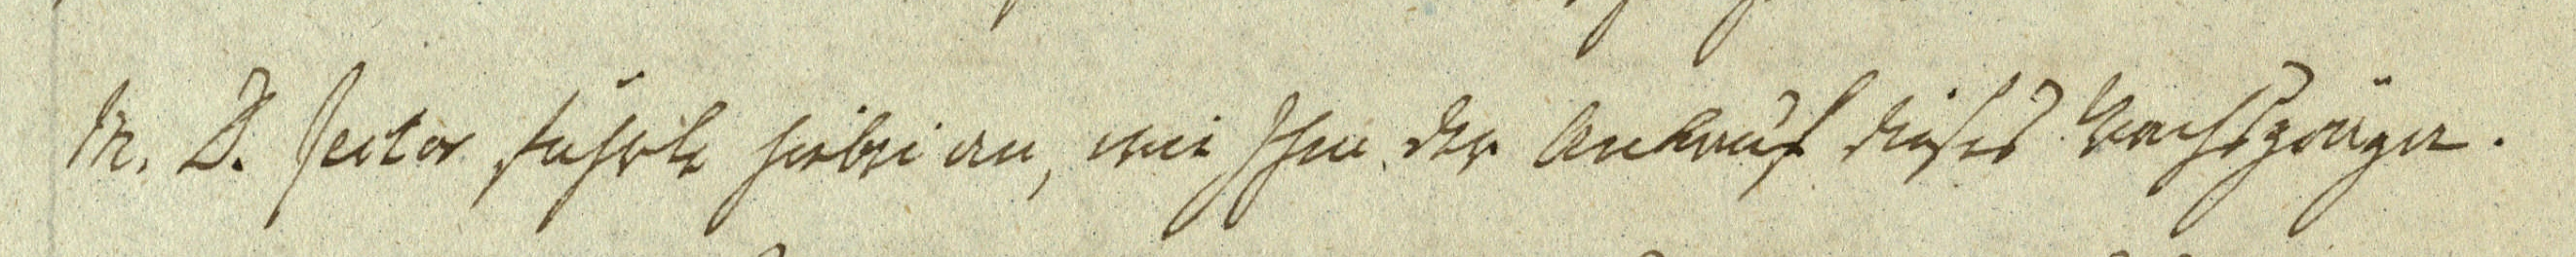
M. D. Rector führte hiebei an, wie Ihm der Ankauf dieses Wachspräpa¬
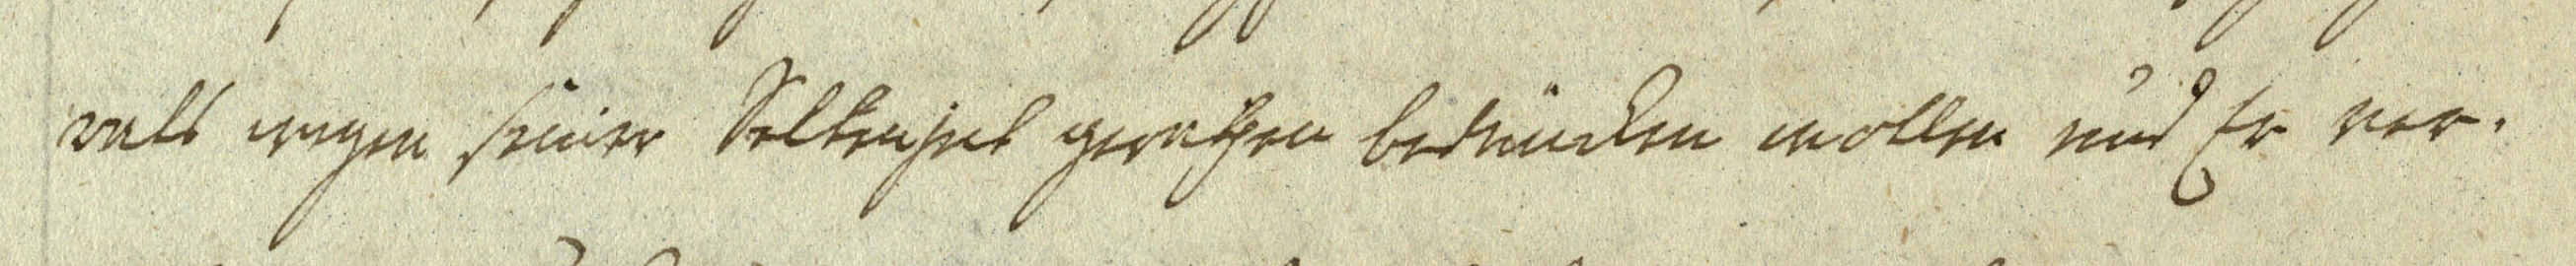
rats wegen seiner Seltenheit gerathen bedüncken wollen und Er ver¬
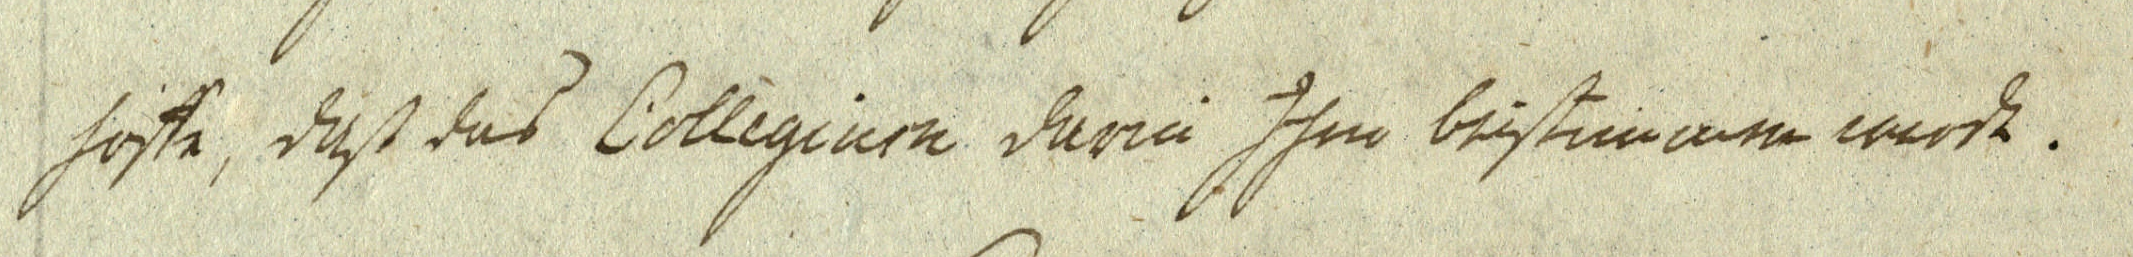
hoffe, daß das Collegium darin Ihm beistimmen werde.
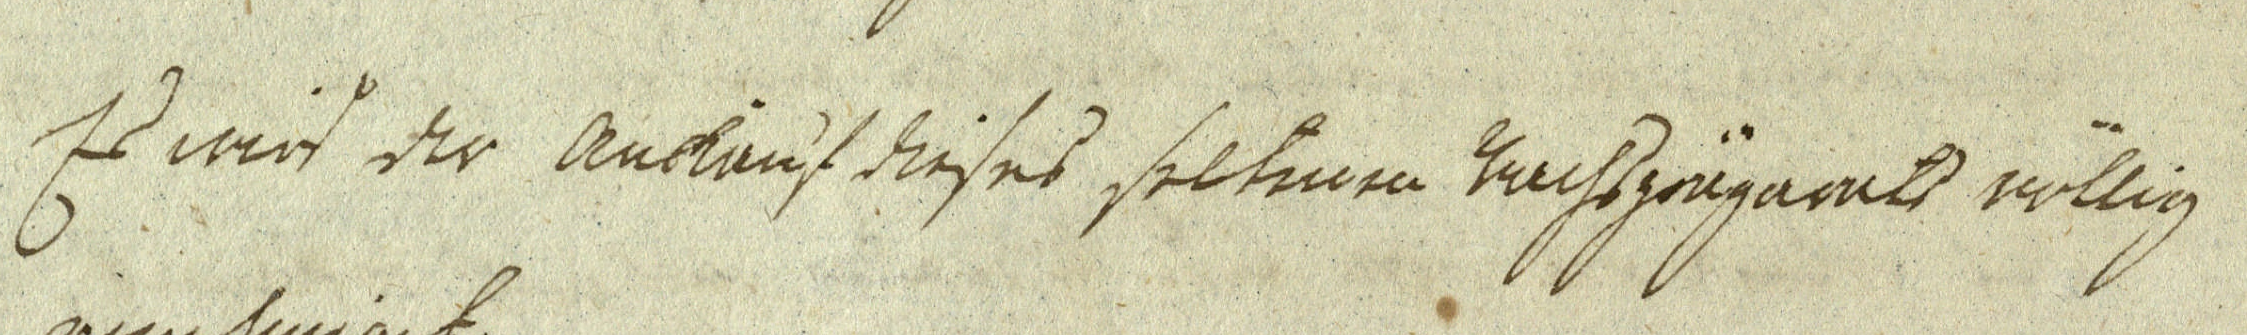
Es wird der Ankauf dieses seltenen Wachspräparats völlig
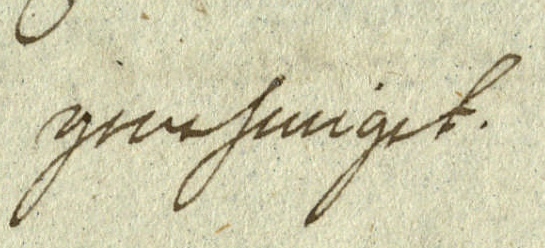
genehmiget.
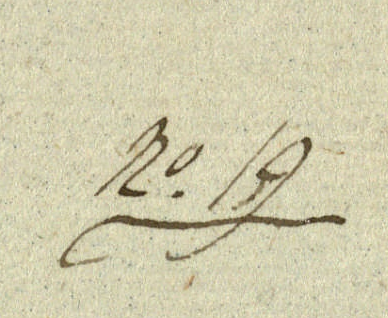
No 19
